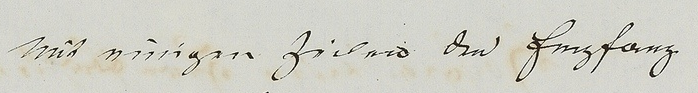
mit einigen Zeilen den Empfang
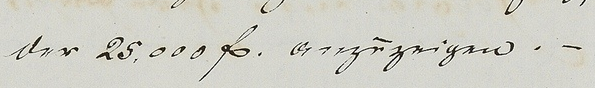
der 25,000 fs. anzuzeigen. –
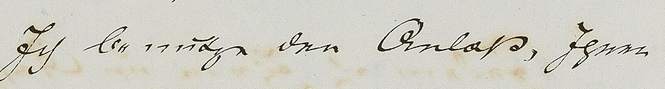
Ich benutze den Anlaß, Ihnen
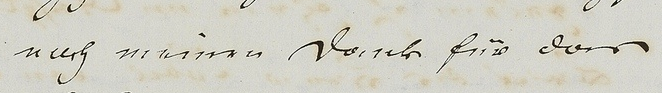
noch meinen Dank für das
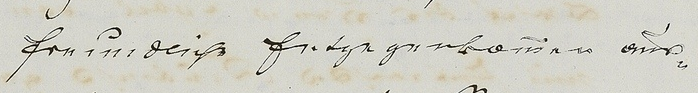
freundliche Entgegenkommen aus-
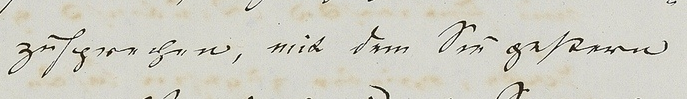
zusprechen, mit dem Sie gestern
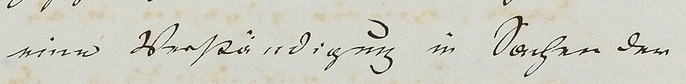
eine Verständigung in Sachen der
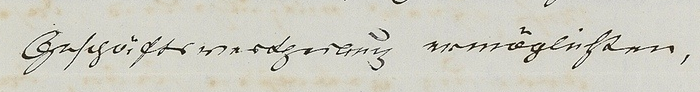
Geschäftsvertheilung ermöglichten,
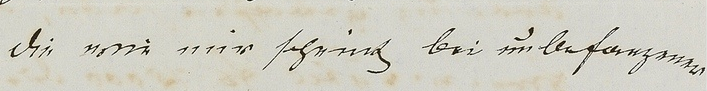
die wie mir scheint bei unbefangener
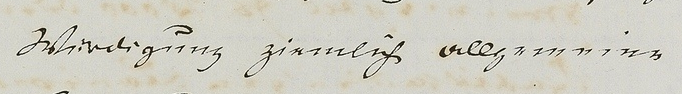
Würdigung ziemlich allgemeine
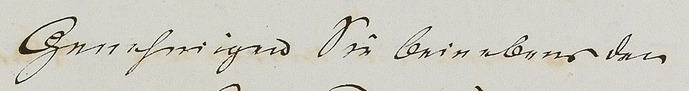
Genehmigen Sie beinebens den
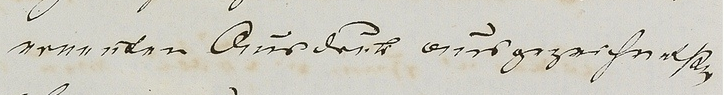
erneuten Ausdruk ausgezeichnetster
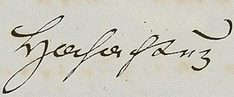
Hochachtung
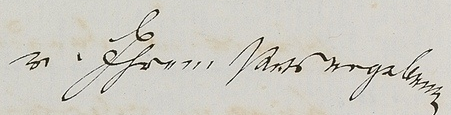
v. Ihrem stets ergebenen
